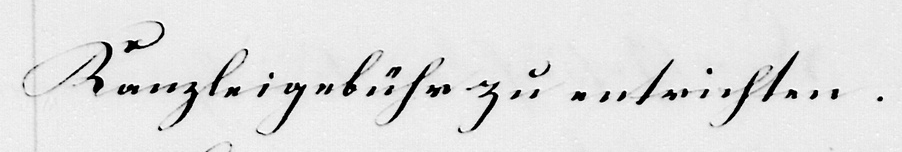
Kanzleigebühr zu entrichten.
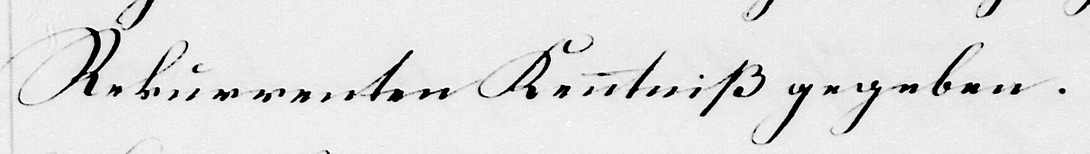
Rekurrenten Kenntniß gegeben.
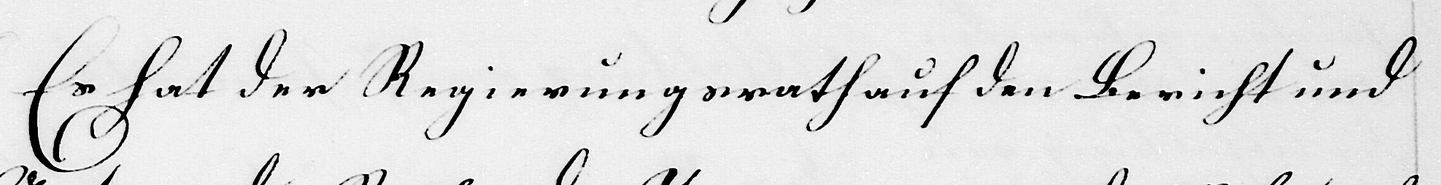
Es hat der Regierungsrath auf den Bericht und
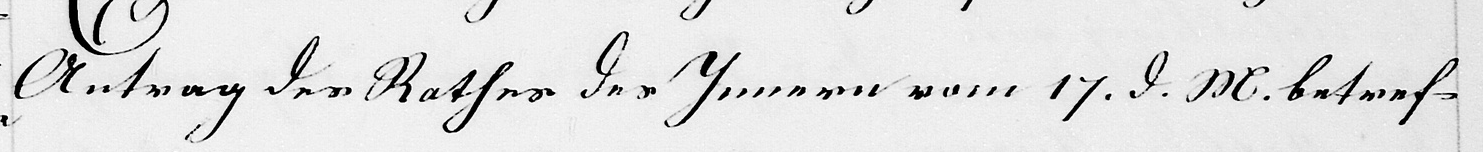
Antrag des Rathes des Innern vom 17. d. M. betref¬
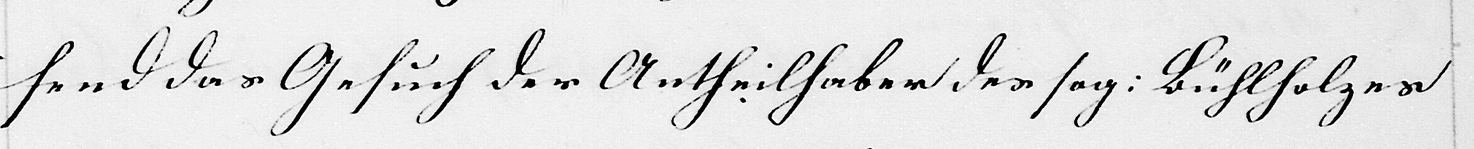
fend das Gesuch der Antheilhaber des sog: Bühlholzes
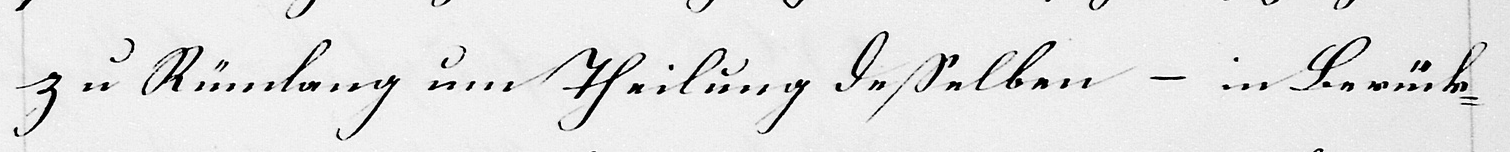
zu Rümlang um Theilung deßelben – in Berück¬
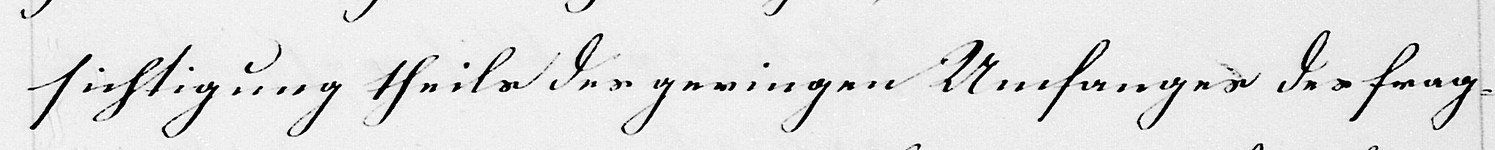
sichtigung theils des geringen Umfanges des frag¬
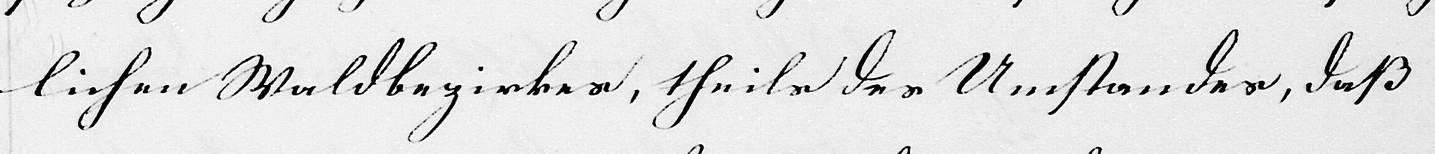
lichen Waldbezirkes, theils des Umstandes, daß
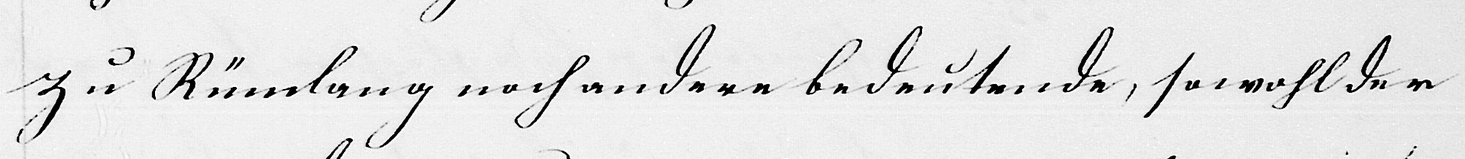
zu Rümlang noch andere bedeutende, sowohl der
